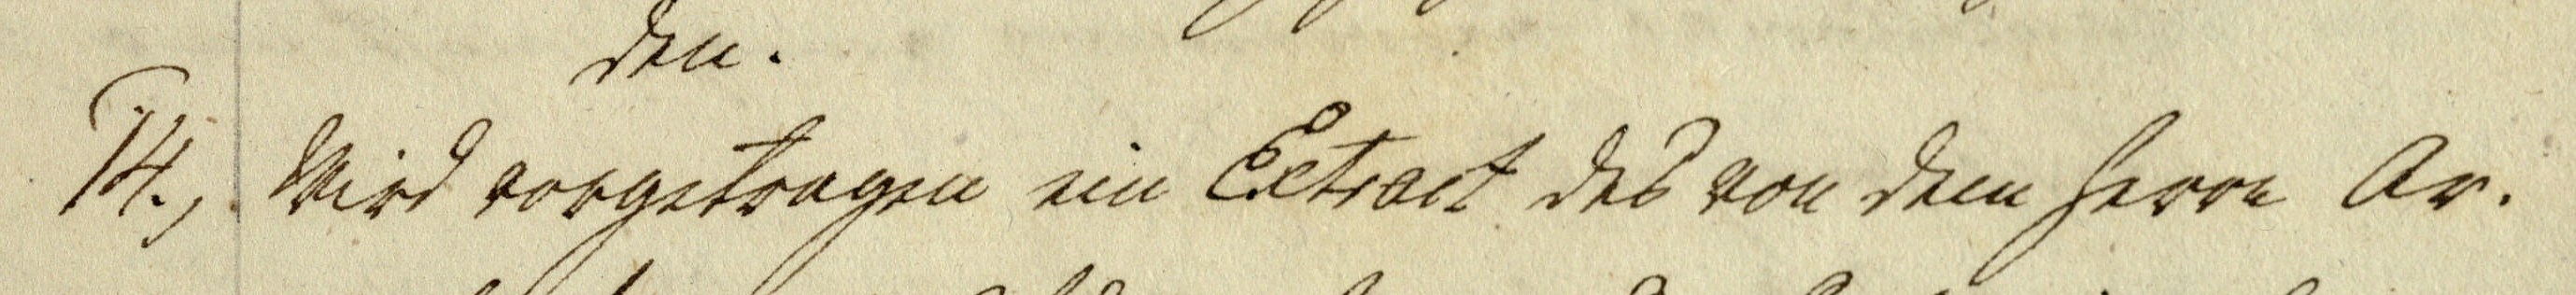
14., Wird vorgetragen ein Extract des von dem Herrn Ar¬
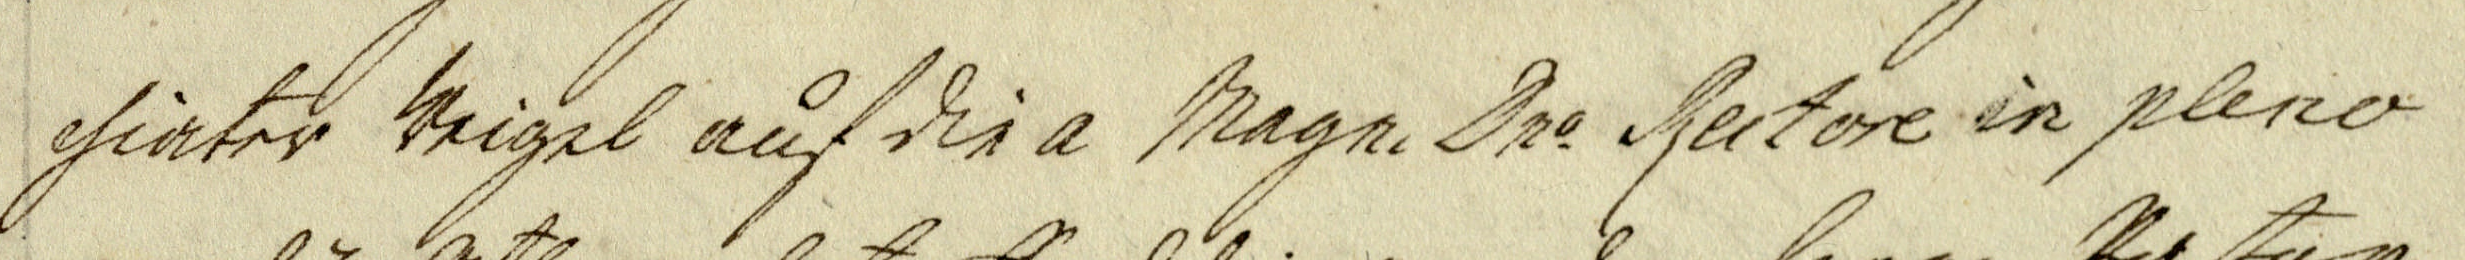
chiater Weigel auf die a Magn. Dn Rectore in pleno
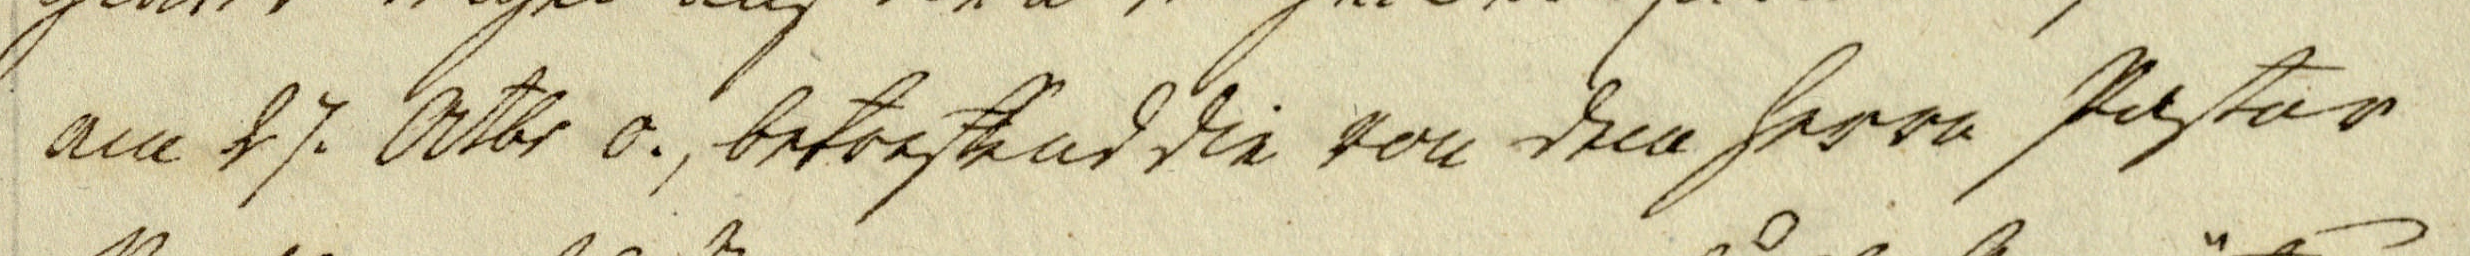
am 27. Octbr c. betreffend die von dem Herrn Pastor
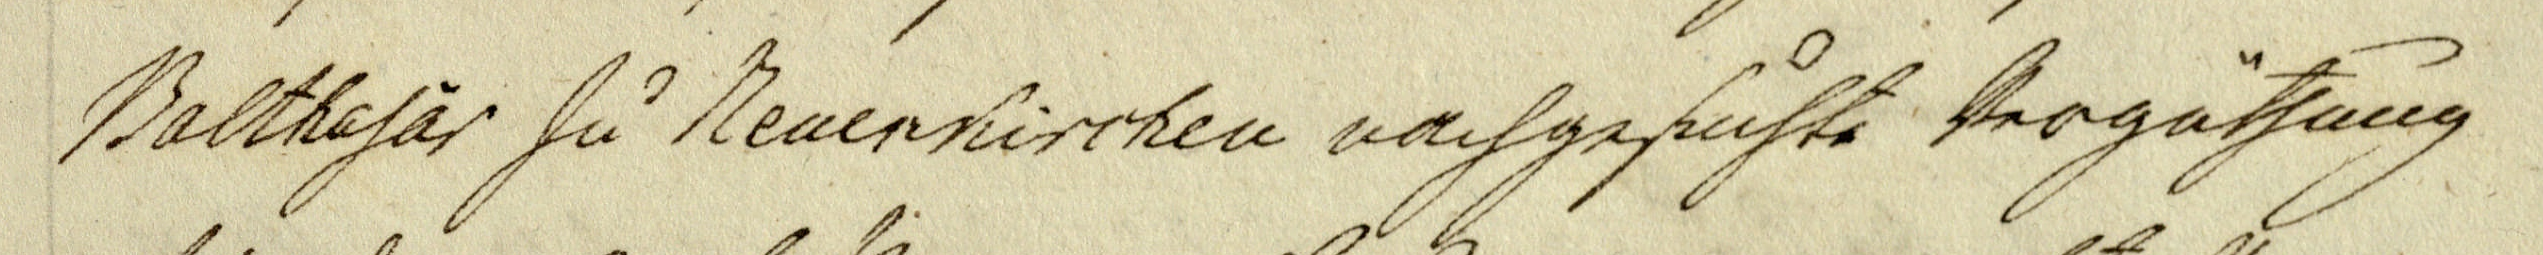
Balthasar zu Neuenkirchen nachgesuchte Vergüthung
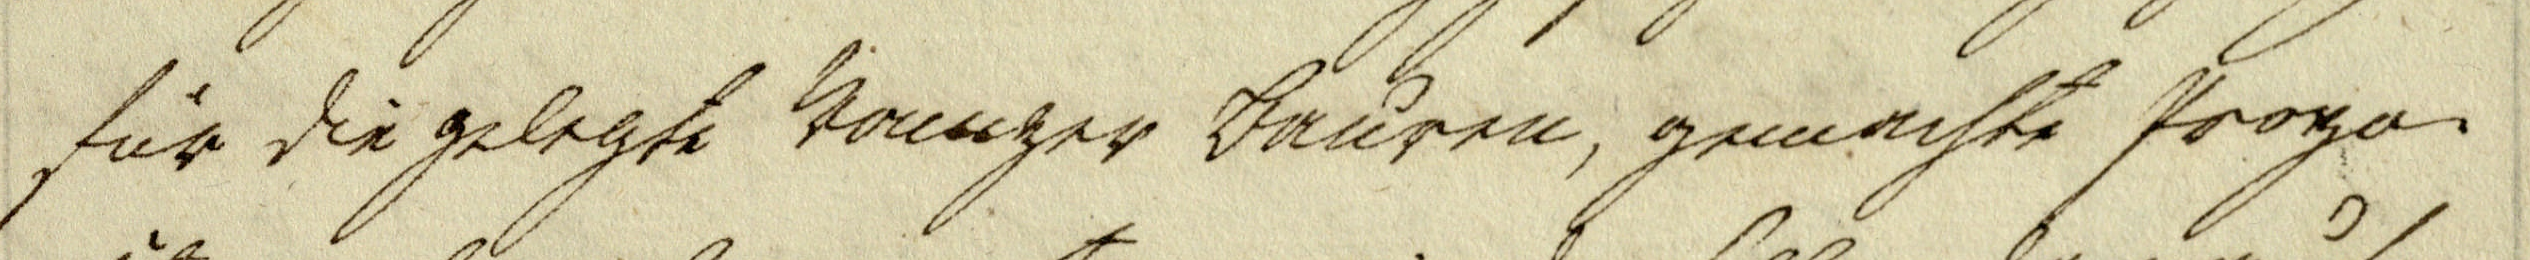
für die gelegte Wamper Bauren, gemachte Propo¬
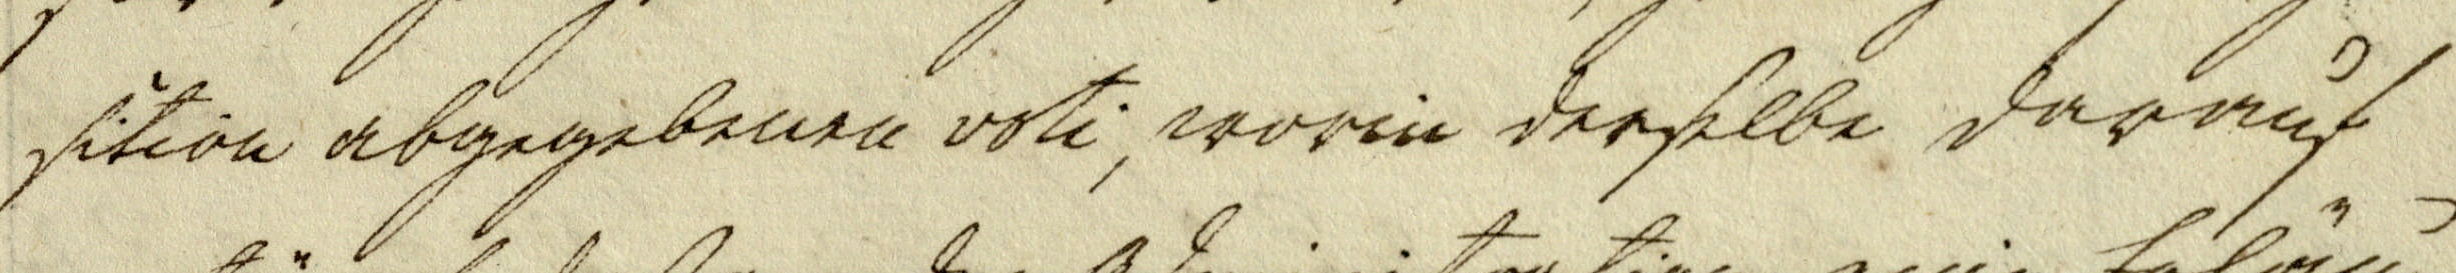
sition abgegebenen voti, worin derselbe darauf
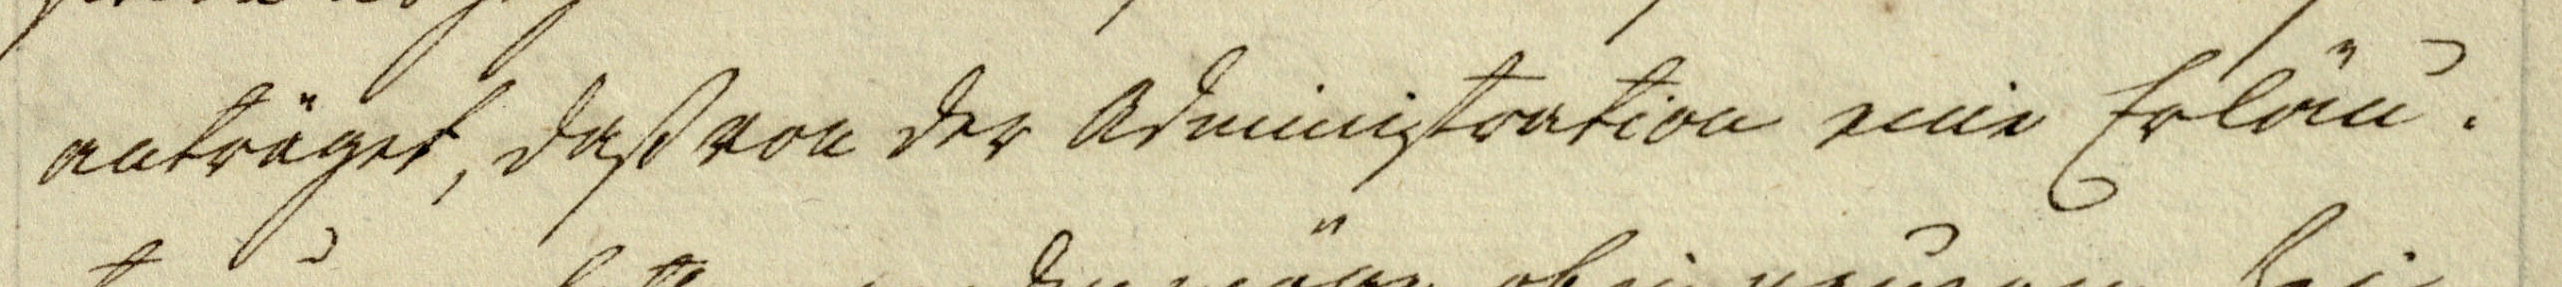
anträget, daß von der Administration eine Erläu¬
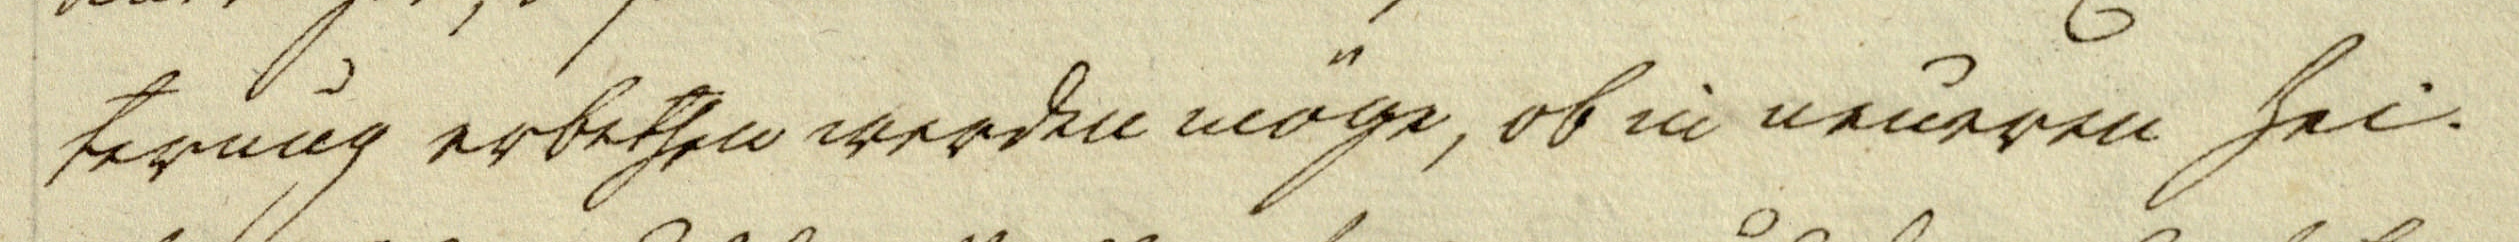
terung erbethen werden möge, ob in neueren Zei¬
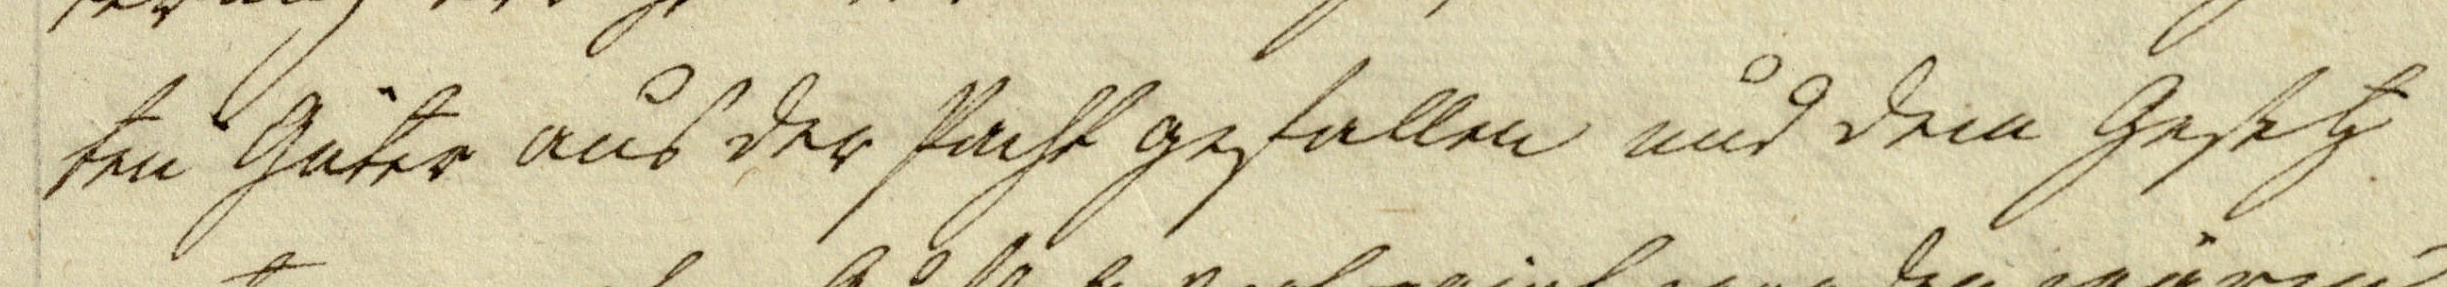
ten Güter aus der Pacht gefallen und dem Gesetz
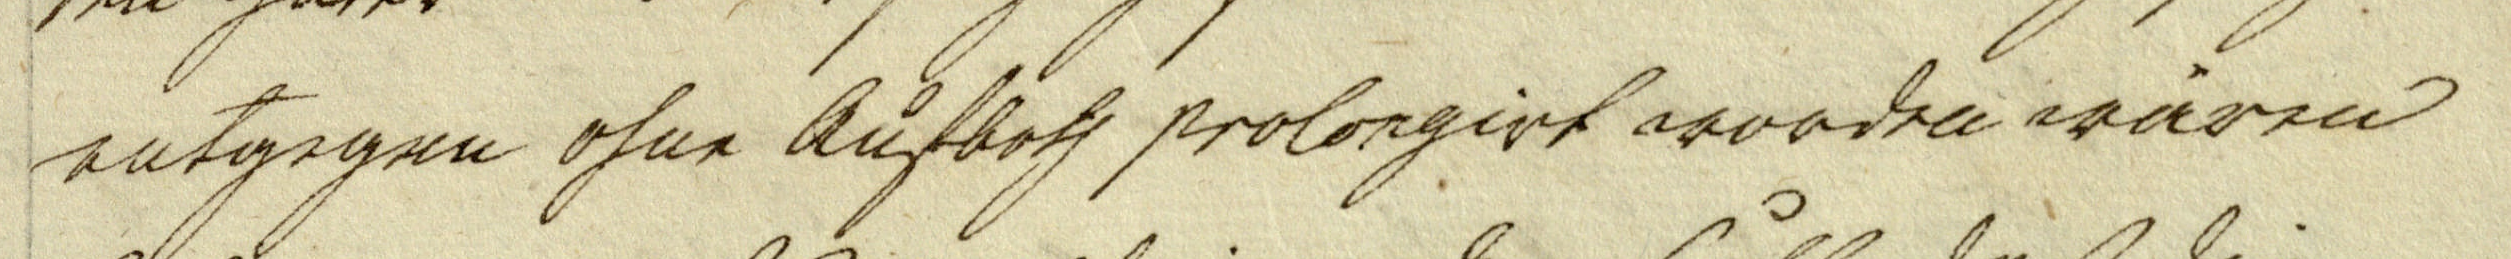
entgegen ohne Aufboth prolongirt worden wären
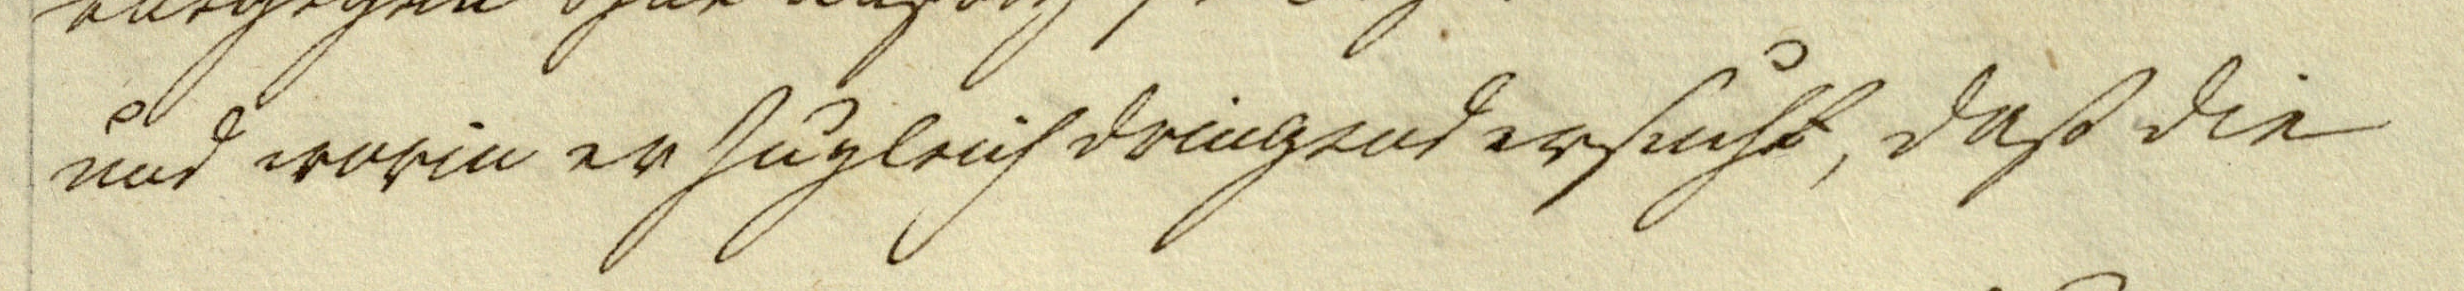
und worin er zugleich dringend ersucht, daß die
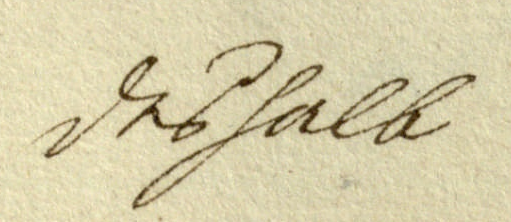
deshalb
